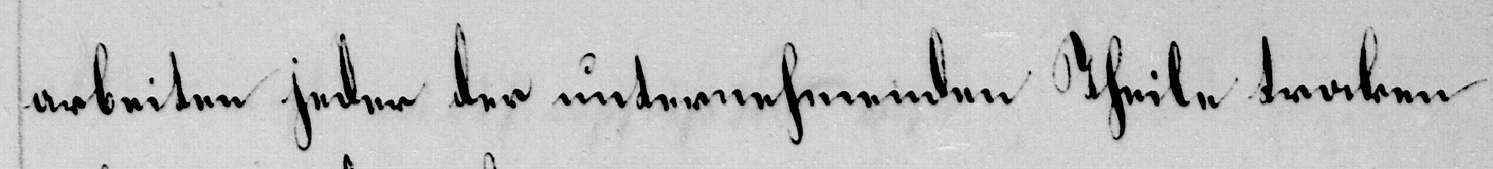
arbeiten jeder der unternehmenden Theile trocken
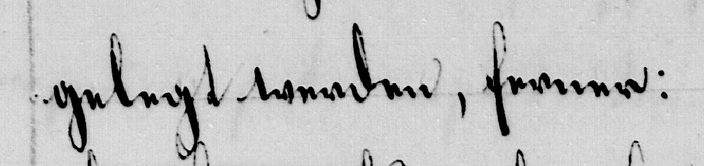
gelegt werden, ferner:
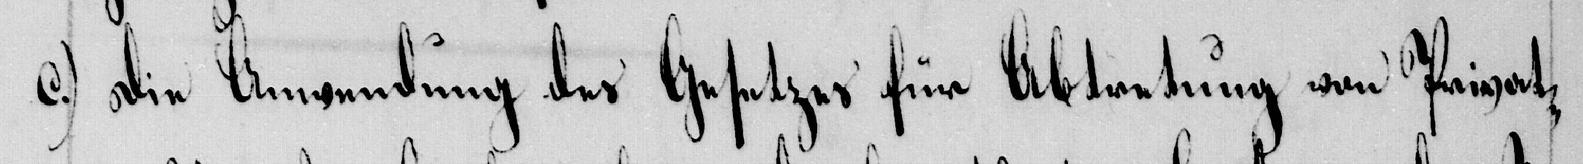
c.) Die Anwendung des Gesetzes für Abtretung von Privat¬
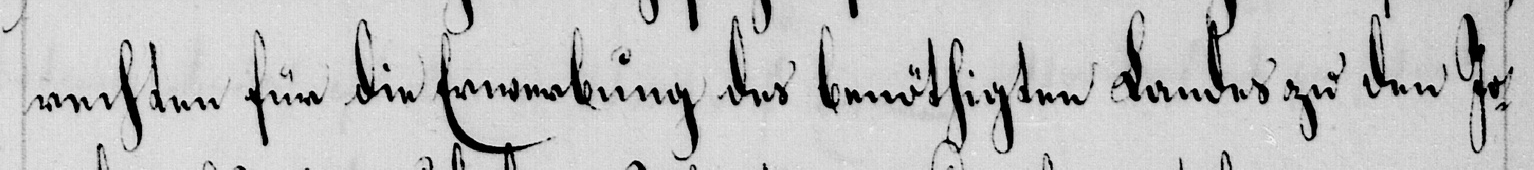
rechten für die Erwerbung des benöthigten Landes zu den Jo¬
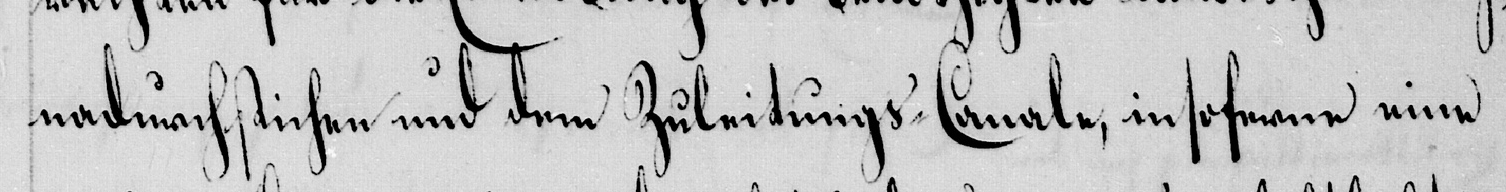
nadurchstichen und dem Zuleitungs-Canale, insoferne eine
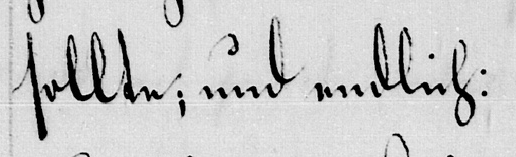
sollte; und endlich:
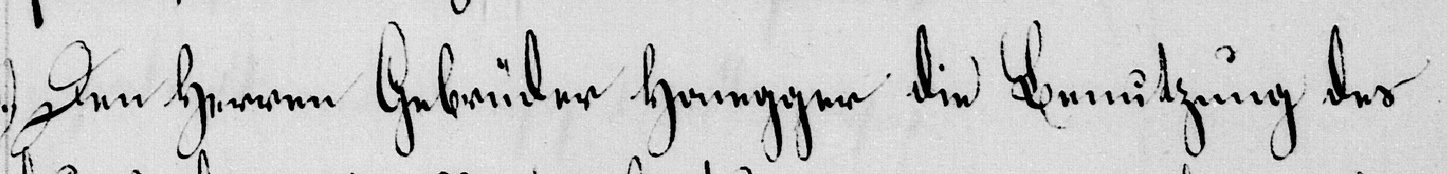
Den Herren Gebrüder Honegger die Benutzung des
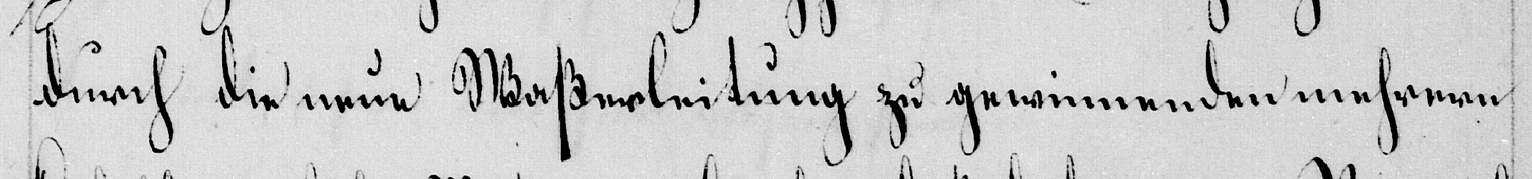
durch die neue Waßerleitung zu gewinnenden mehrern
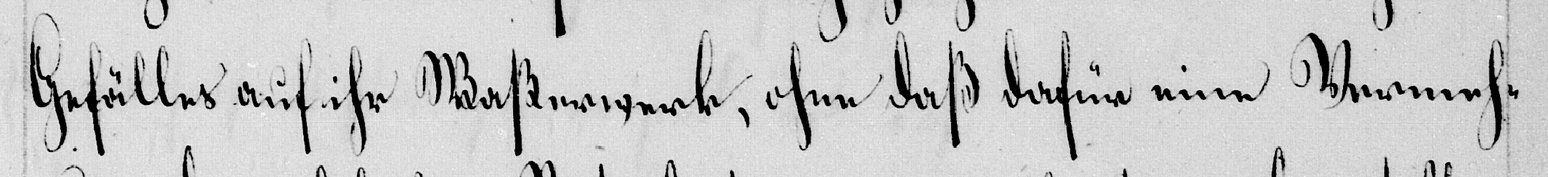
Gefälles auf ihr Waßerwerk, ohne daß dafür eine Vermeh¬
